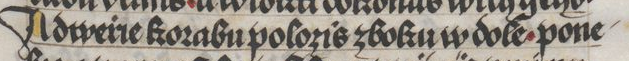A dweṙie korabu poloziṡ zboku w dole.pone¬
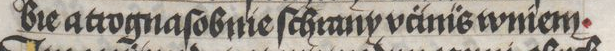bíe a trognaſobnie ſchrany vċiníṡ wníem.
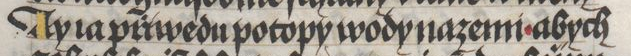Ay ia pṙiwedu potopy wody nazemí.abych
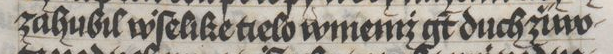zahubil wẛelike tielo wniemż ḡt duch žiwo¬
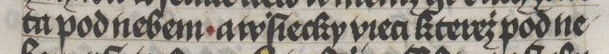ta pod nebem.a wẛiecky vieci ktereż pod ne¬
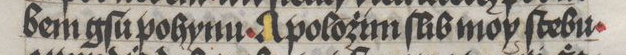bení gſu pohynu.Apolożím ſlib moy ſtebu.
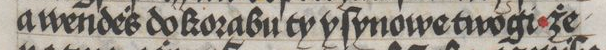a wendeṡ do korabu ty y ſynowe twogi.że¬
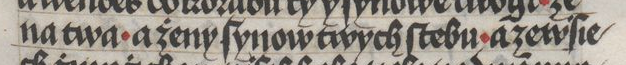na twa.a żeny ſynow twych ſtebu.a zewẛie
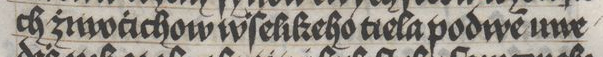ch żiwoċichow wẛelikeho tiela podwe uwe¬
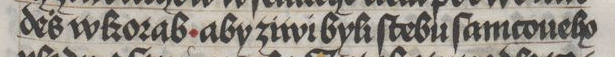deṡ wkorab.aby ziwi byli ſtebu ſamcoueho
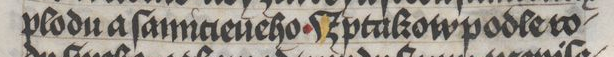plodu a ſamicieneho.Zptakow podle ro¬
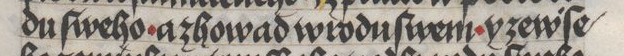du ſweho.a zhowad wrodu ſwem.y zewẛe¬
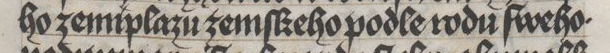ho zemiplazu zemſkého podle rodu ſweho.
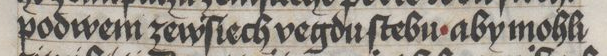podwem zewẛiech yegdu ſtebu.aby mohli
